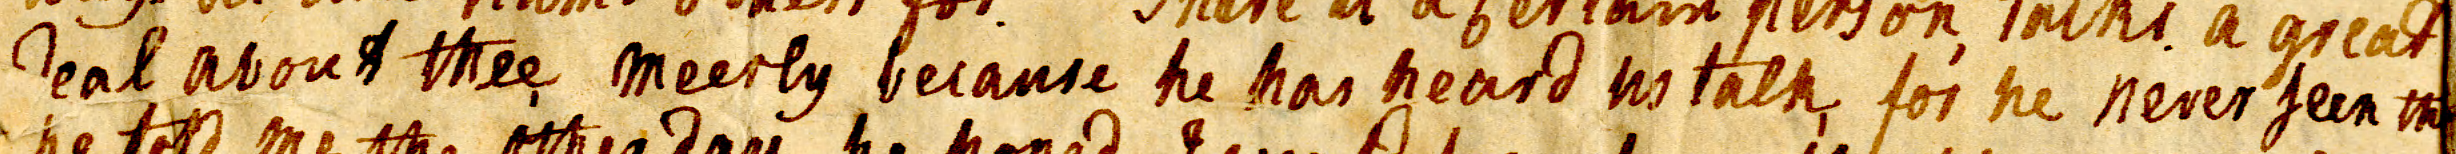deal about thee meerly because he has heard us talk for he never seen the
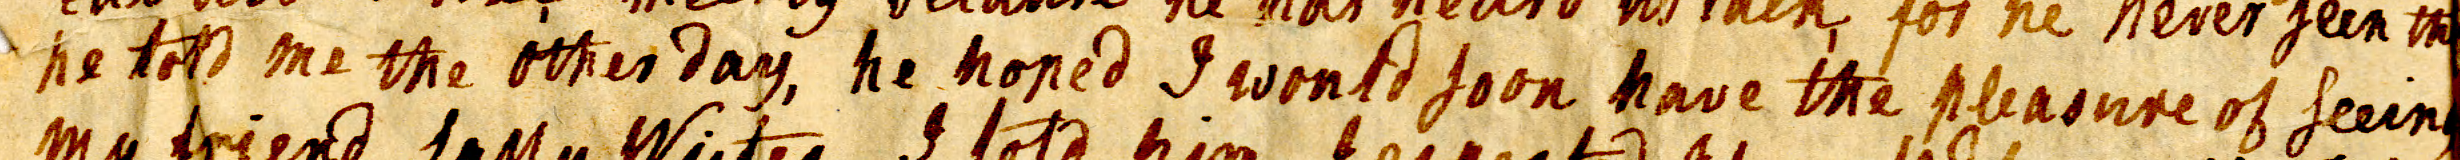he told me the other day he hoped I would soon have the pleasure of seeing
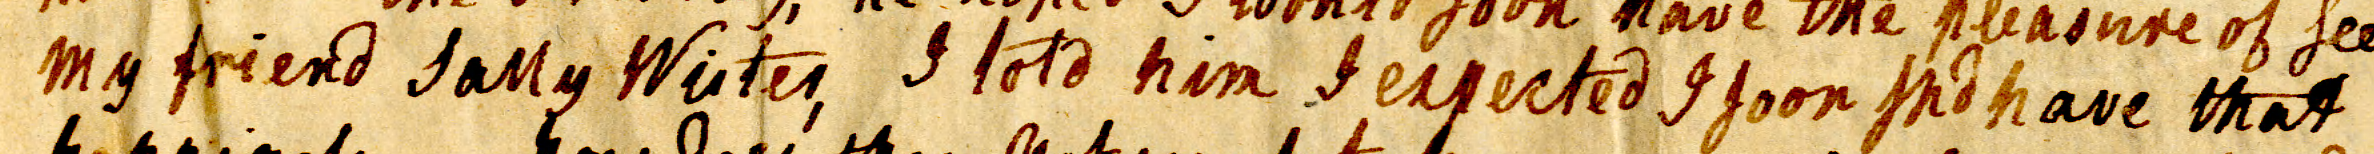my friend Sally Wister, I told him I expected I soon shd have that
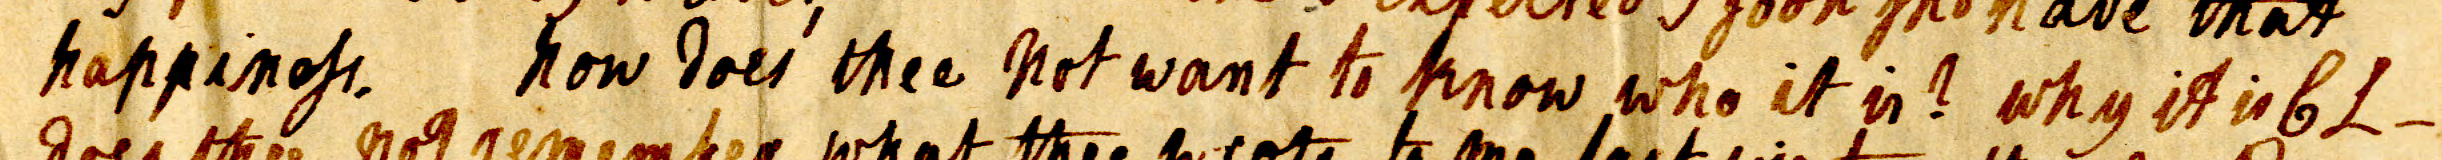happiness. how does thee not want to know who it is? Why it is CL-
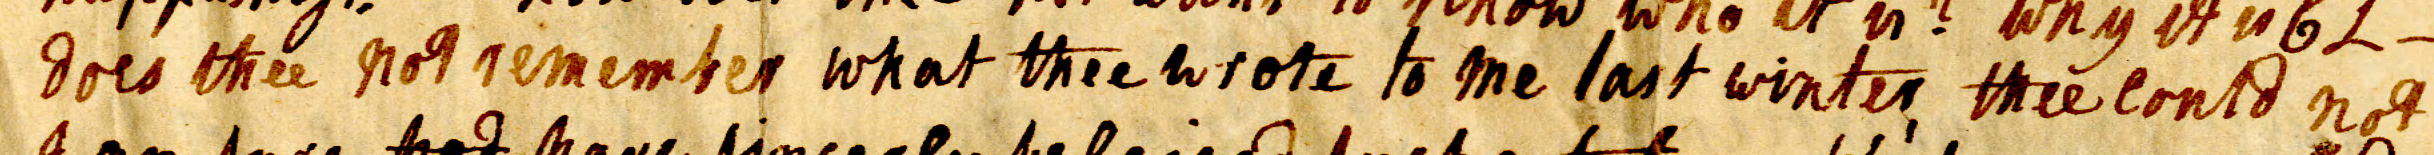does thee not remember what thee wrote to me last winter, thee could not
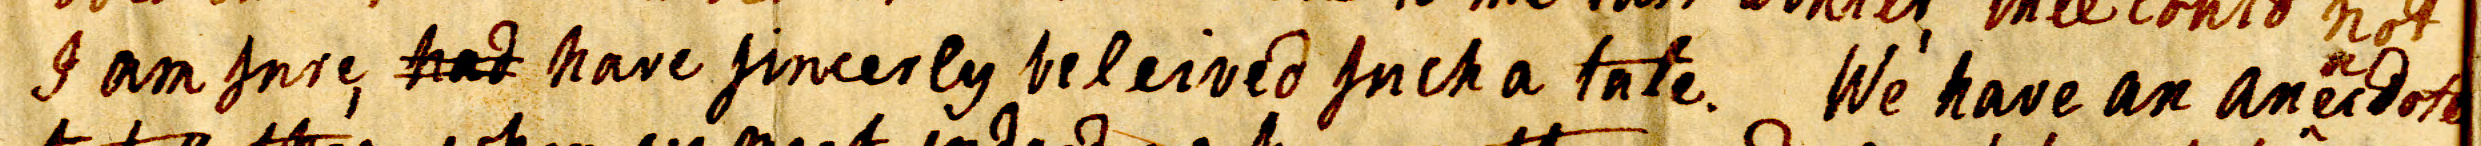I am sure, [had] have sincerely beleived such a tale. We have an an^necdote
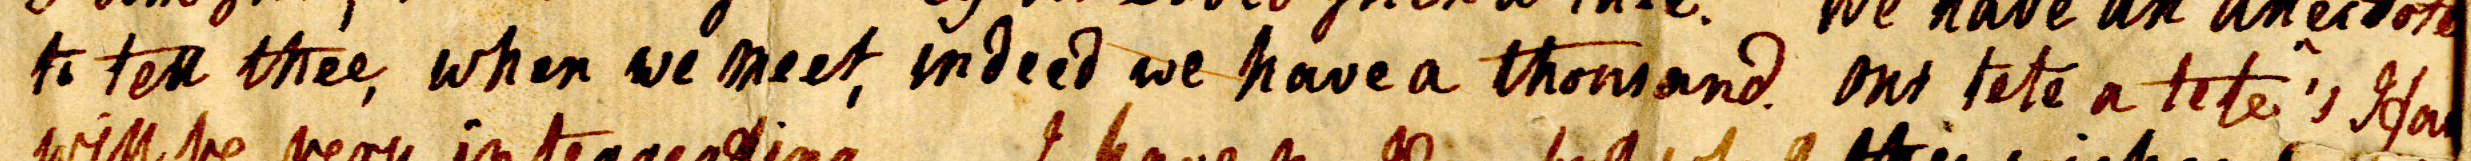to tell thee when we meet indeed we have a thousand our tete a tete's Ha
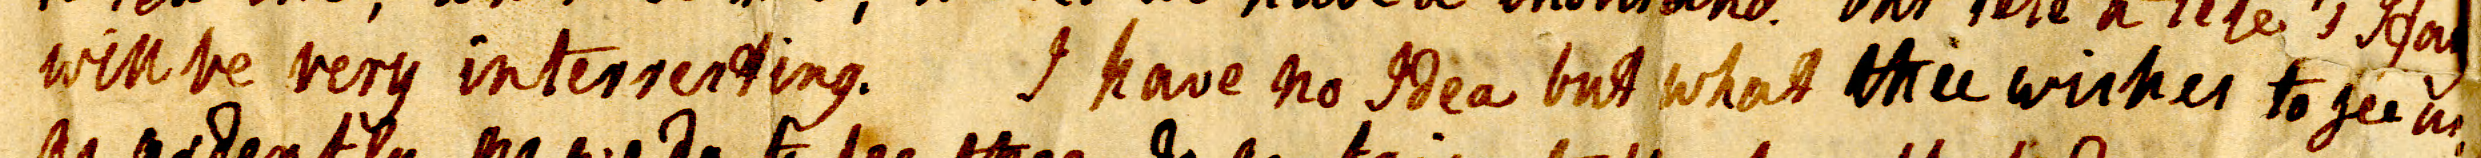will be very interesting. I have no idea but what thee wishes to see us,
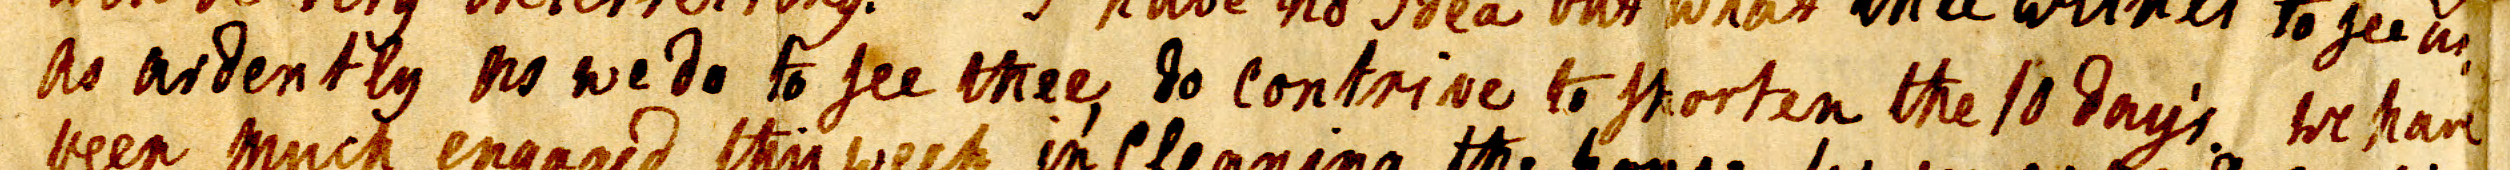as ardently as we do to see thee, do contrive to shorten the 10 day's. we have
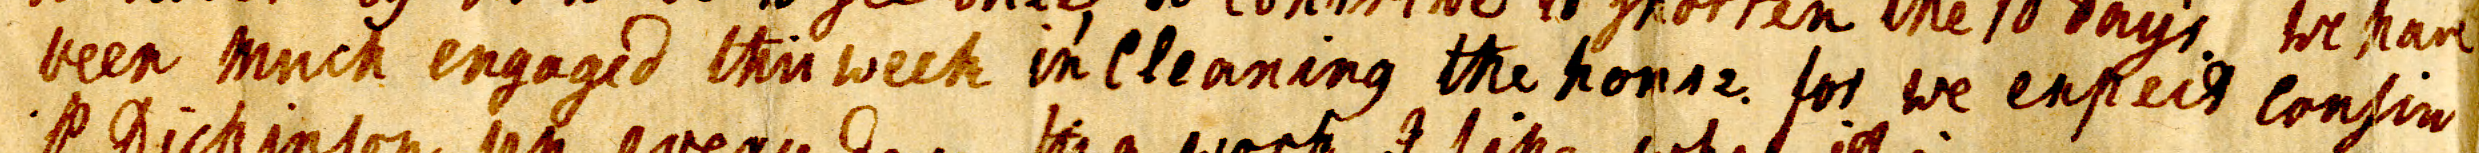been much engaged this week in cleaning the homes for we expect cousin
